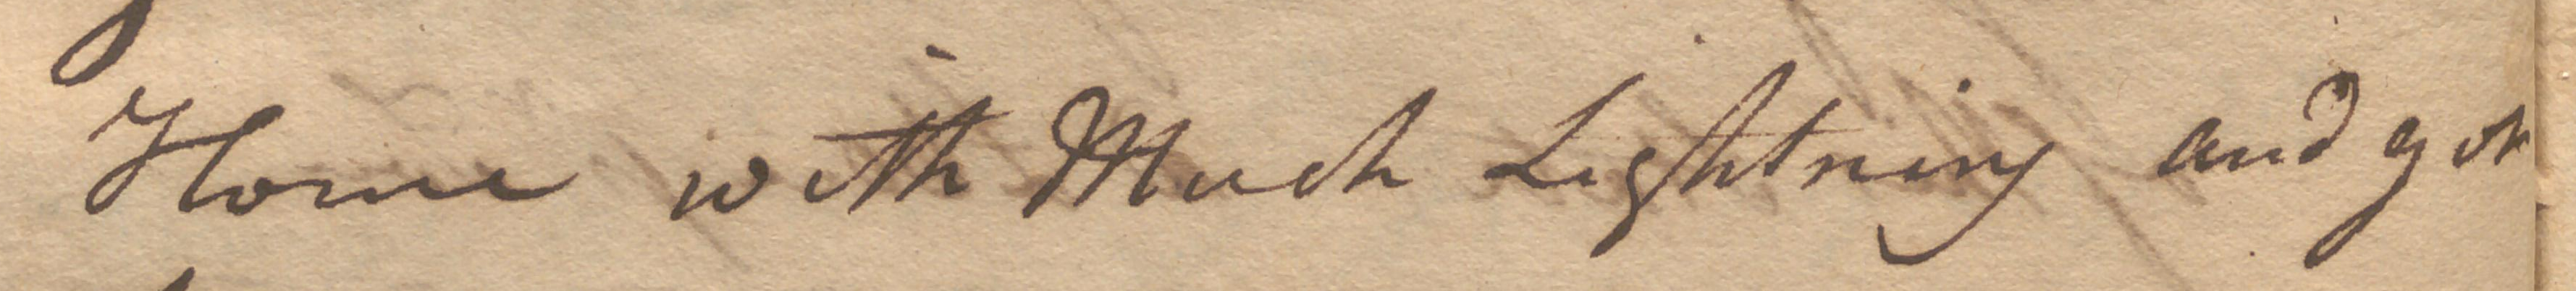Home with Much Lightning and got
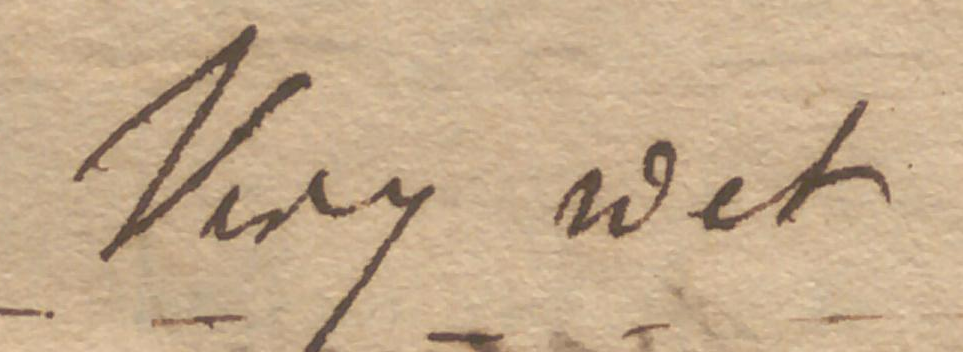Very wet
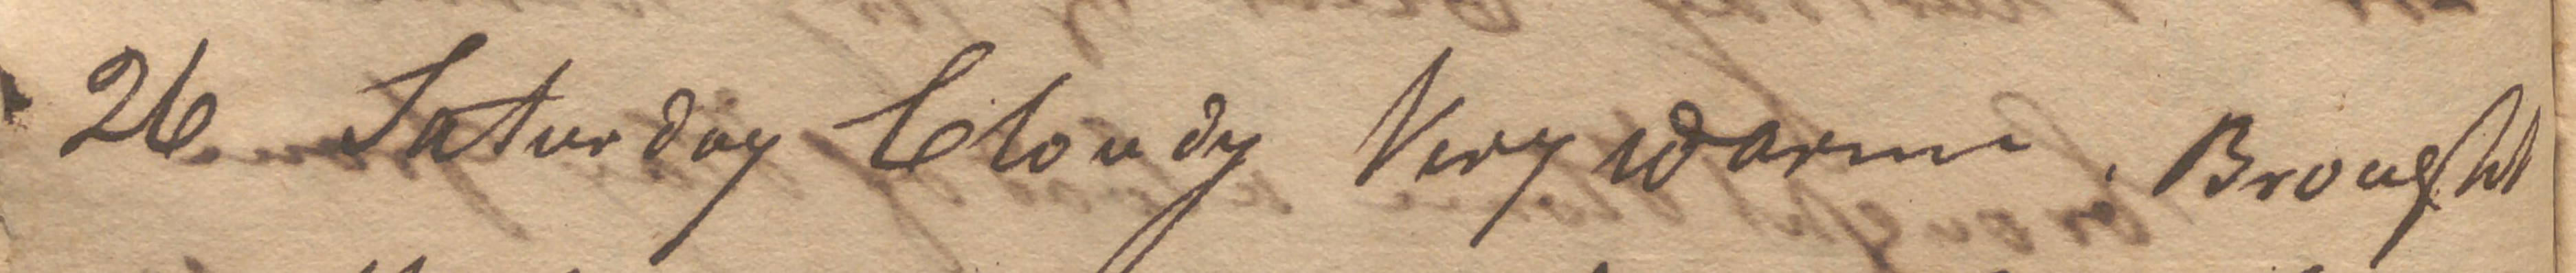26 Saturday Cloydy Very warm Brought
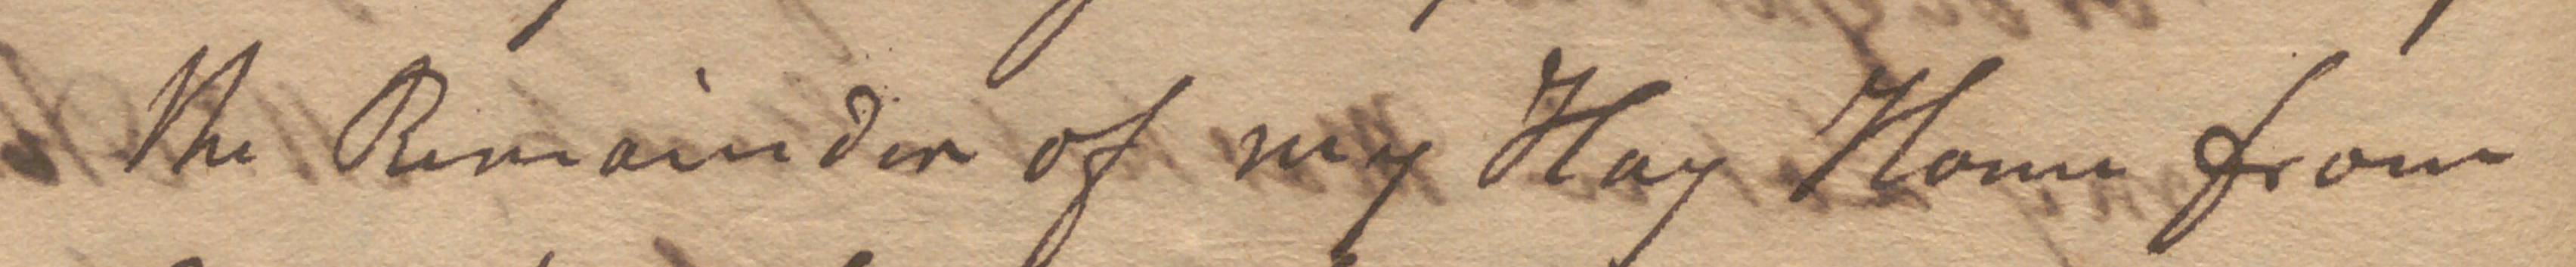the Remainder of my Hay Home from
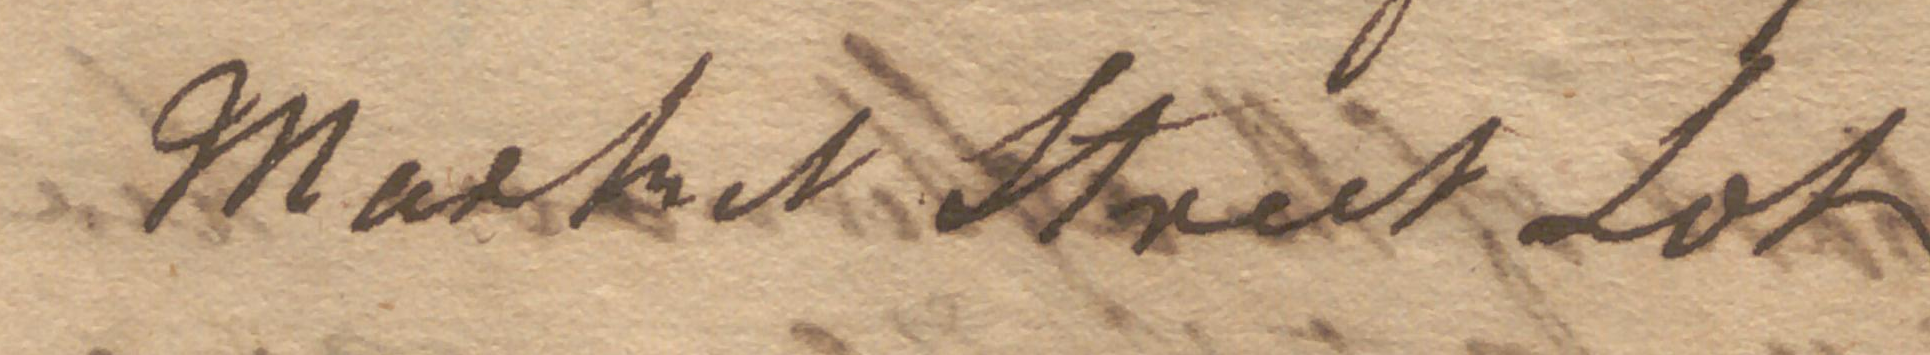Market Street Lot
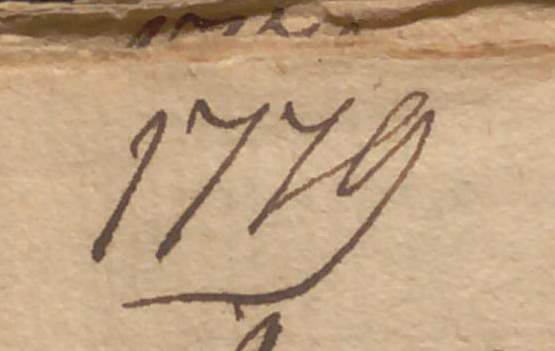1779
